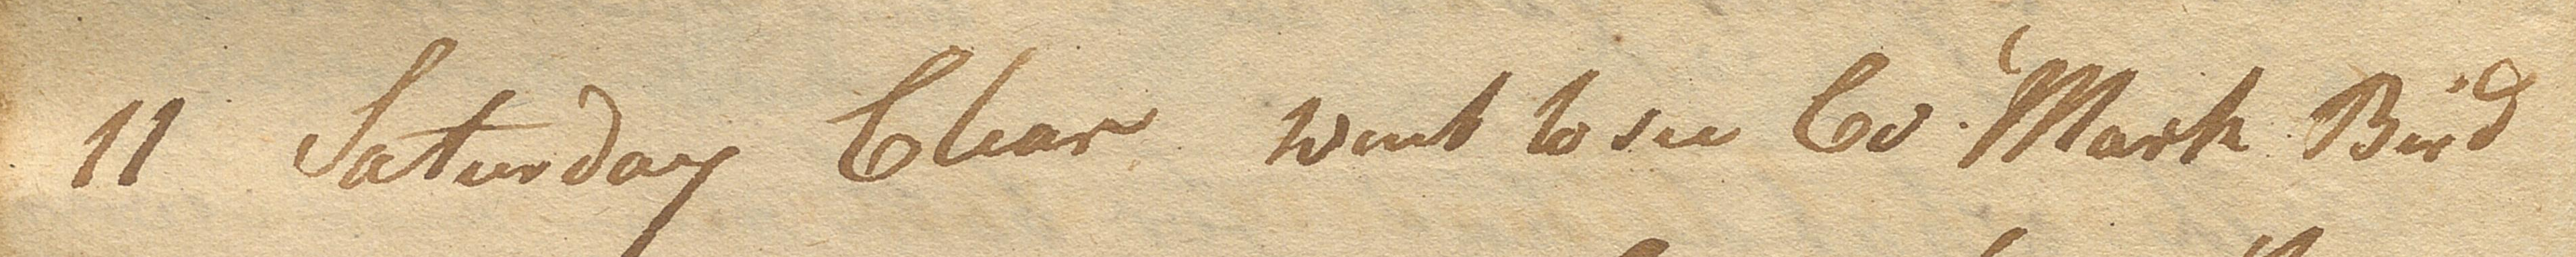11 Saturday Clear went to see Co^l. Mark Burd
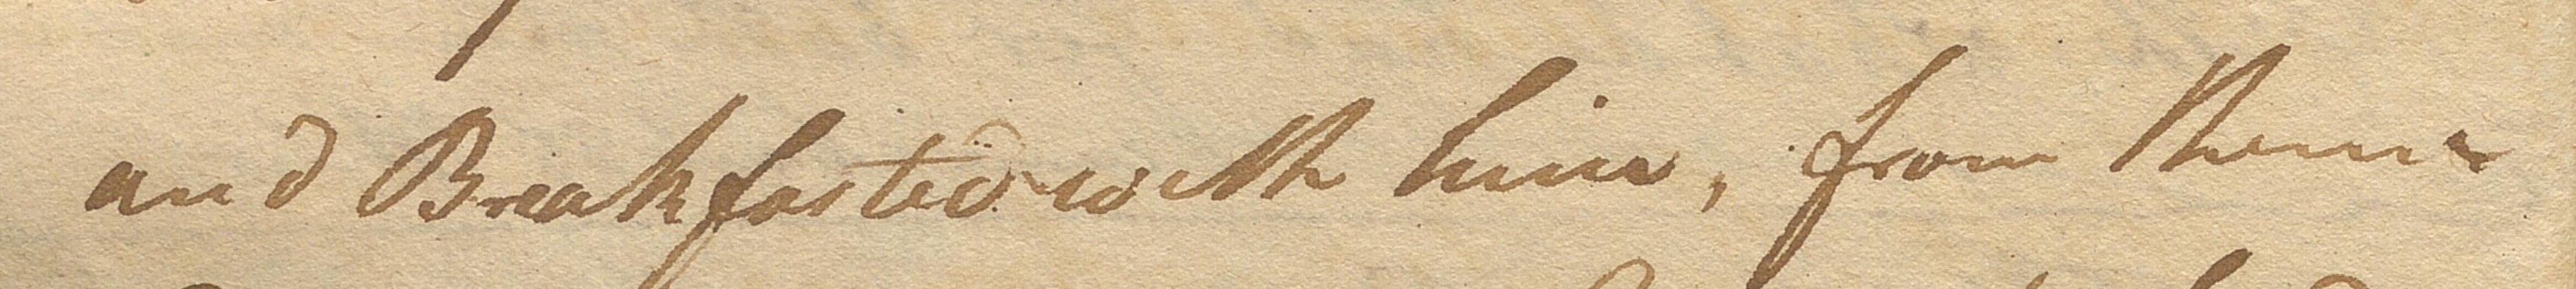and Breakfasted with him, from thence
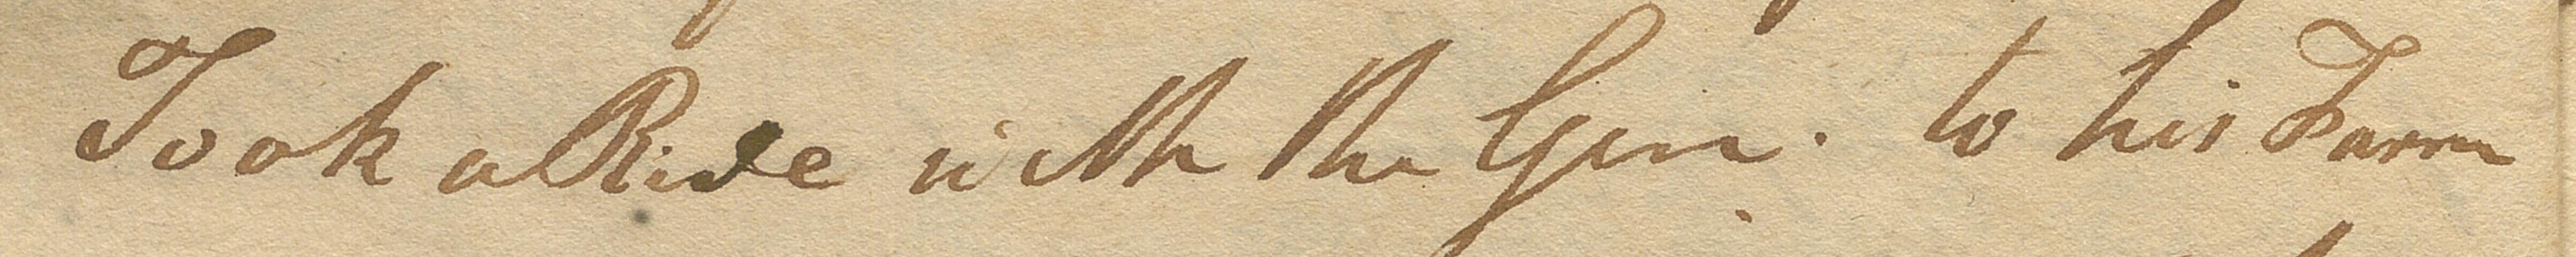Took a Ride with the Gen^l. to his Farm
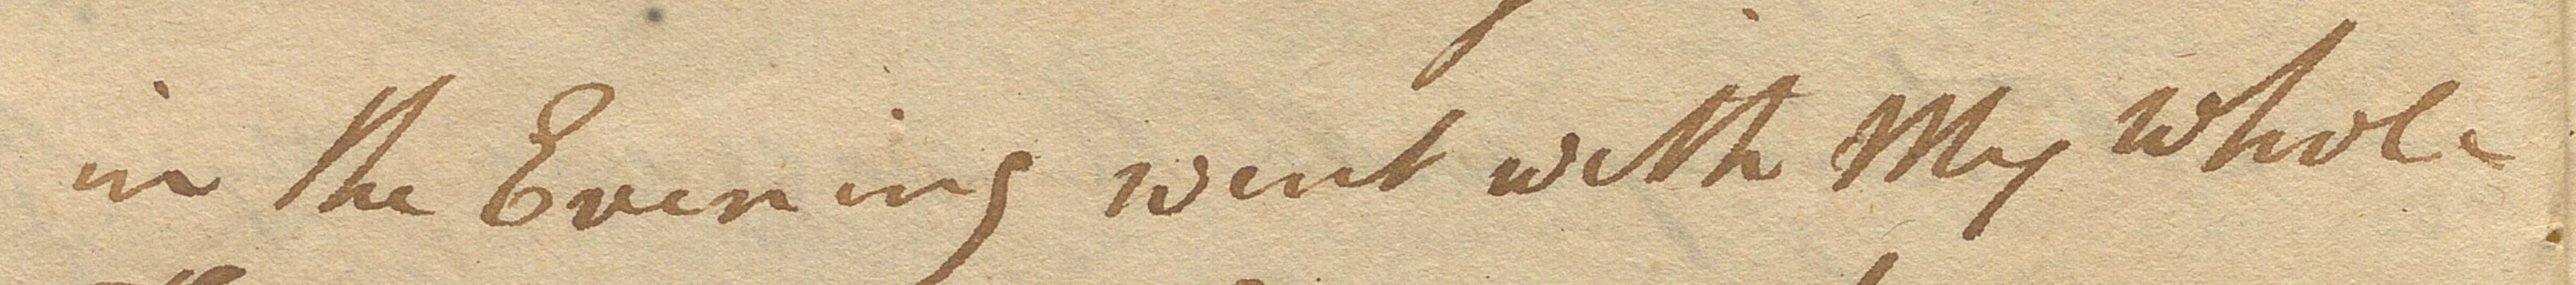in the Evening went with My whole
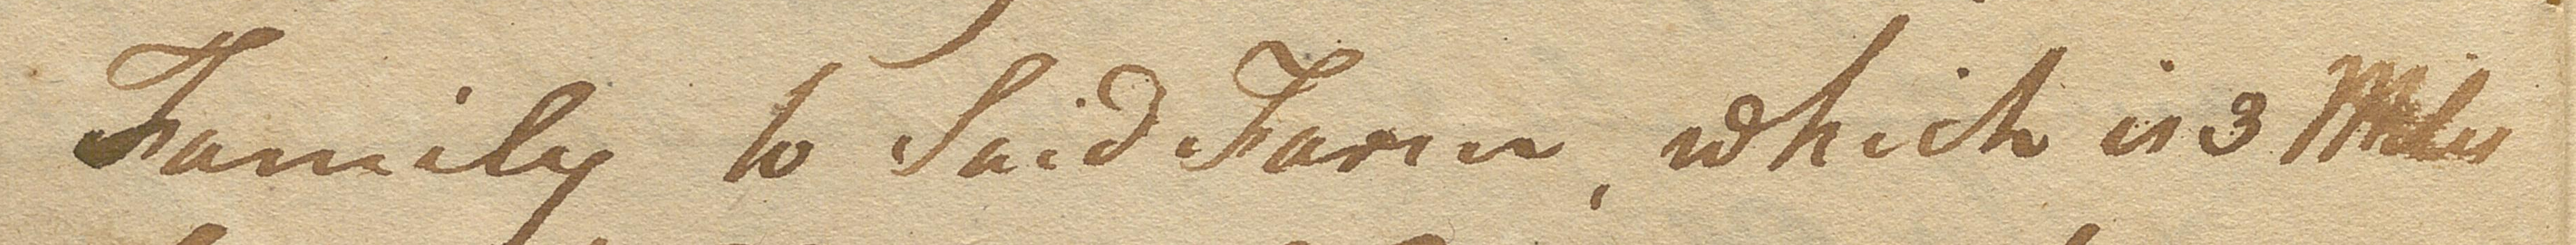Family to Said Farm which is 3 Miles
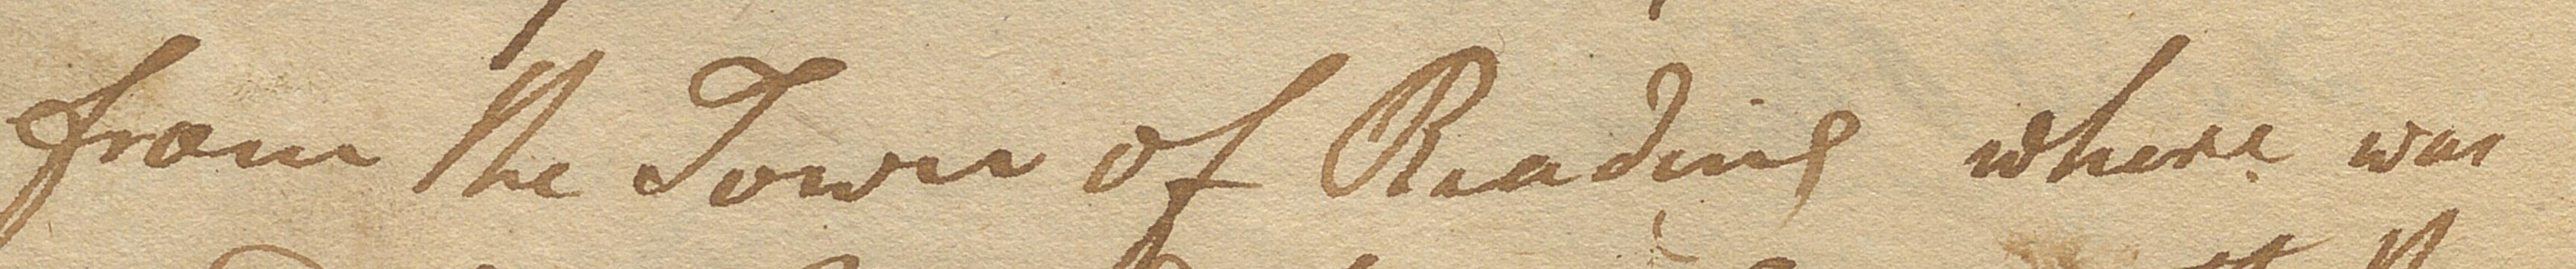from the Town of Reading where was
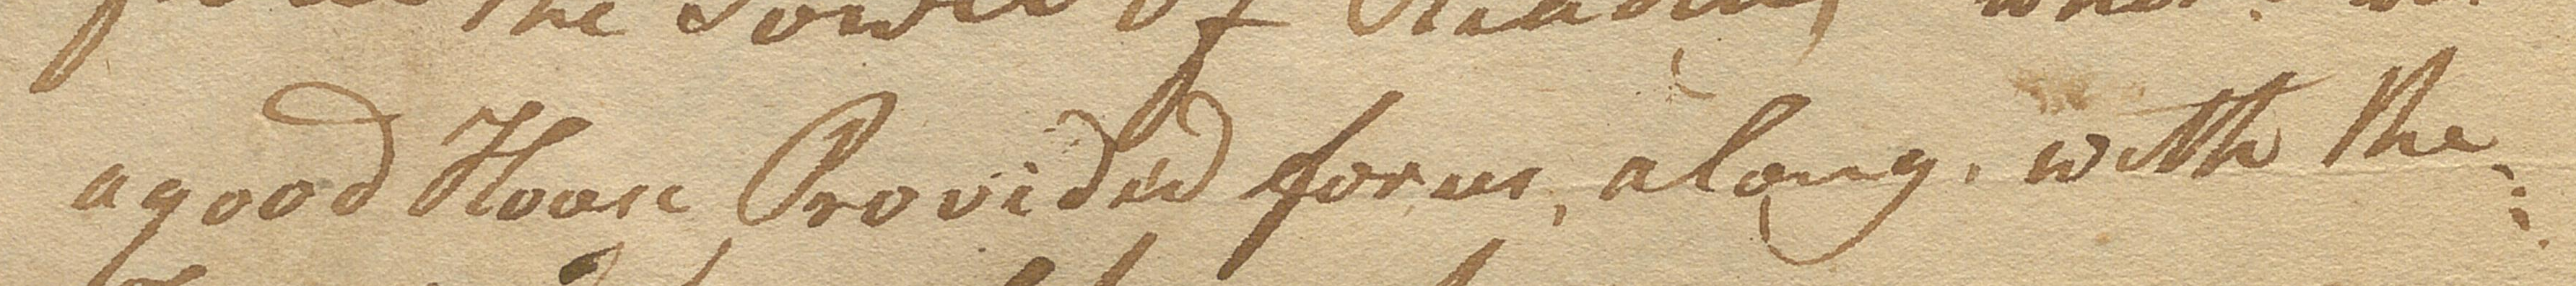a good House Provided for us along, with the
